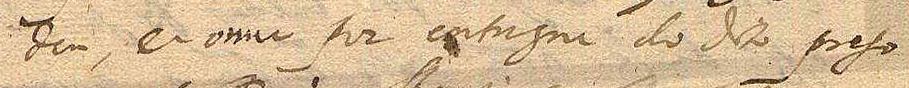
deu, e ouue por entregue do dito preso
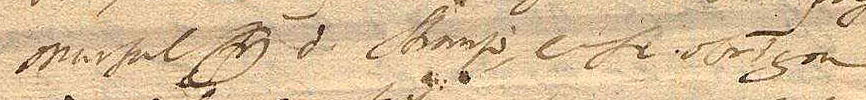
marsal f̄rz d Araujo, e se obrigou
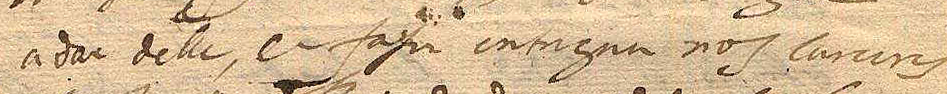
a dar delle, e faser entregua nos carceres
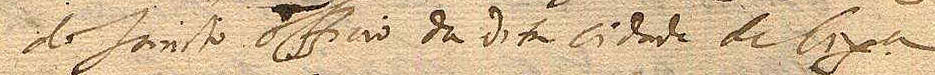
do sancto officio da dita cidade de lix.a
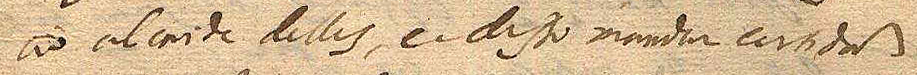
ao alcaide delles, e disto mandou certidaõ
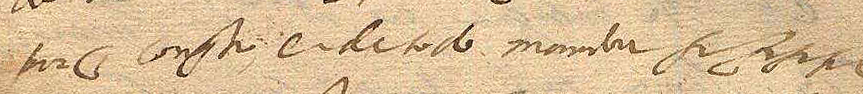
porq̄ consta, e de todo mandou se fesese
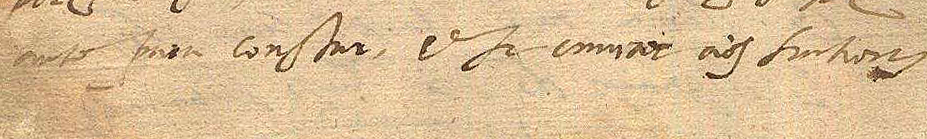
auto para constar, E se enuiar aos senhores
